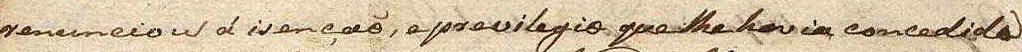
renunciou á isençaõ, e previlegio que lhe havia concedido
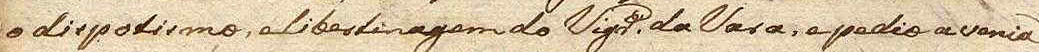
o dispotismo, e libertinagem do Vigr.o da Vara, e pedio a venia
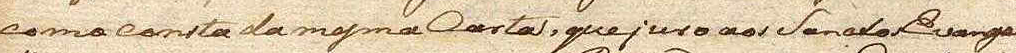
como consta da mesma Carta, que juro aos Sanctos Evange
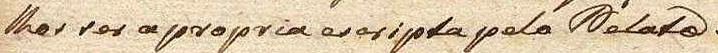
lhos ser a propria escripta pelo Delato.
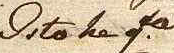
Isto he q.to
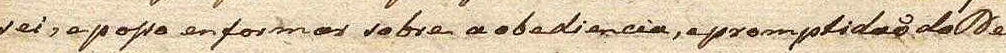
sei, e posso enformar sobre a obediencia, e promptidaõ do De
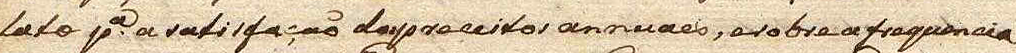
lato p.a a satisfaçaõ dos preceitos annuaes, e sobre a frequencia
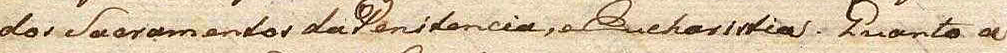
dos Sacramentos da Penitencia, e Eucharistia. Quanto a
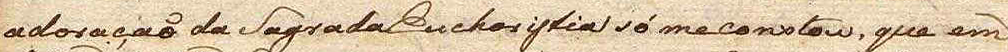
adoraçaõ da Sagrada Eucharistia só me constou, que em
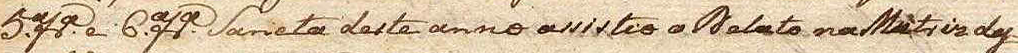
5.a fr.a e 6.a fr.a Sancta deste anno assistio o Delato na Matriz des
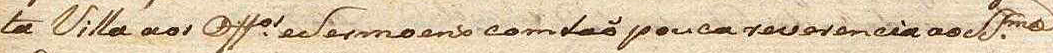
ta Villa aos Off.os e Sermoens com taõ pouca reverencia ao SS.mo
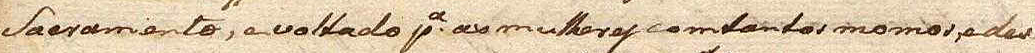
Sacramento, e voltado p.a as mulheres com tantos momos, e des
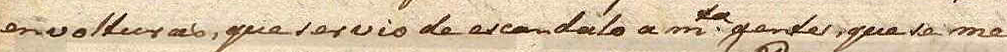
envolturas, que servio de escandalo a m.ta gente, que se me
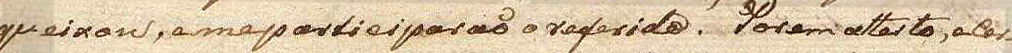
queixou, e me participaraõ o referido. Porem attesto, e Cer
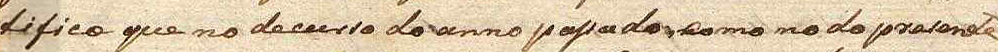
tifico que no decurso do anno passado, como no do presente
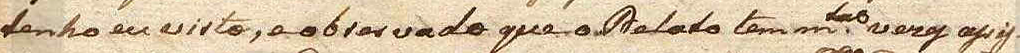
tenho eu visto, e observado que o Delato tem m.tas vezes assis
